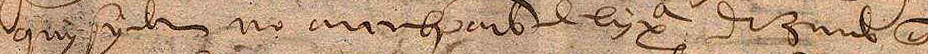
quysydor no arcebp̄ado de lyxa dizemdo q̄
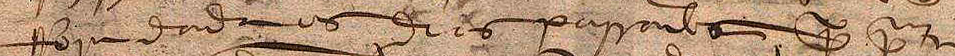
ffora dada os dias passados p̄o p̄te
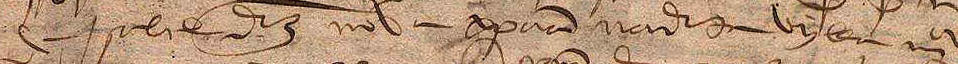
de Jsabel d̄iz nova xpāa na dita vylla mor
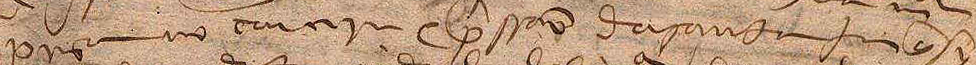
presa no carcere e p̄ssão da santa Jmq̄sy
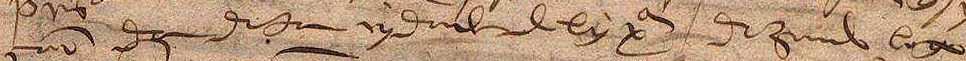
cão da dita cydade de lyxa / dizemdo logo
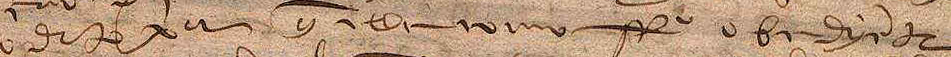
o dito pior q̄ elle como ffo obedyēte
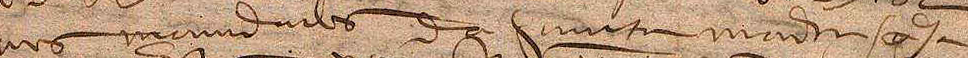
aos mamdados da Samta madre JḡJa
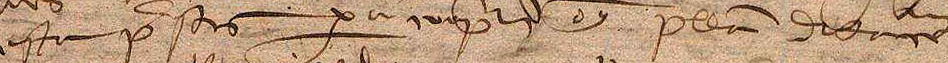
esta p̄stes ꝑa comp̄r o q̄ pllā dita c̄ta
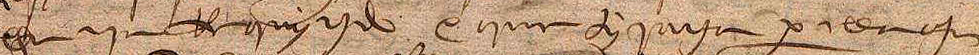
lhe era Requyrjdo e que tyrarja ꝑ ella a Jm
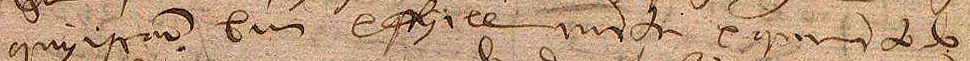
quyrjcão bem e ffyellmēte e que ē todo
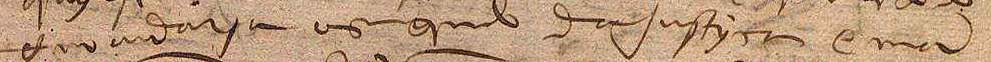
guoardarja o segredo da Justyca e mā
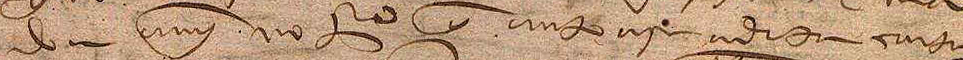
dou a m̄j notro q̄ autoase a dita carta
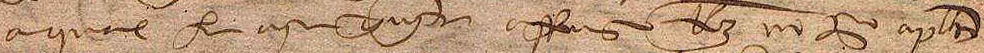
a qual he a segūjte affonso R̄oz notro ap̄llco
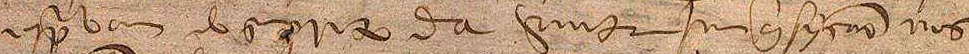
esp̄vam do secreto da Santa Jmqisycão nos
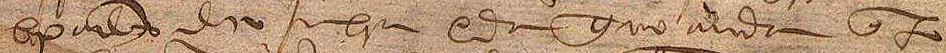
bpad̄os de coJmbra e da guoarda q̄ ho
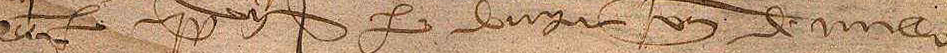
q̄ ho esp̄vy S ho doutor Joam de mello
